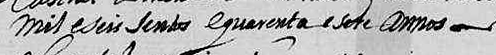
mil e seissentos e quarenta e sete annos
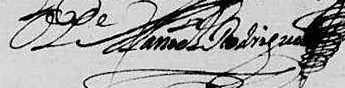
O Pe Manoel Rodrigues
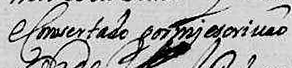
e Consertado por mj̄ escriuaõ
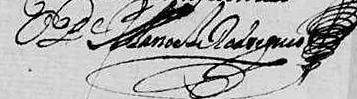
O Pe Manoel Rodrigues
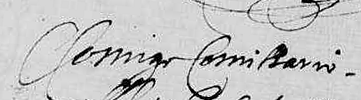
E Comigo Comissario.
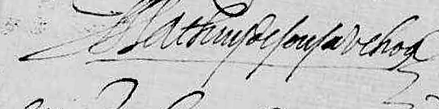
Matheus de sousa vchoa
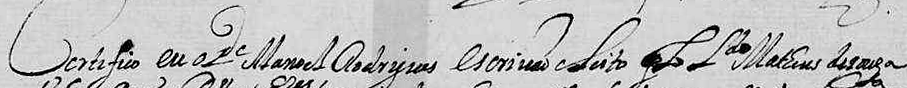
Certifico eu o Pe Manoel Rodrigues escriuaõ eLeito plo Ldo Matheus de souza
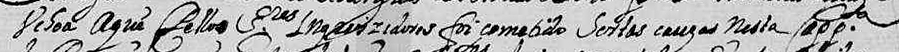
Vchoa a quē Pellos S.ores Inquizidores foi cometido Sertas cauzas nesta Capp.ta
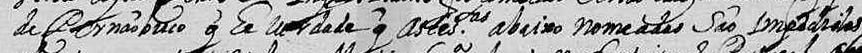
de Pernaõbuco q̄ he uerdade q̄ as tes.tas abaixo nomeadas São impedidas
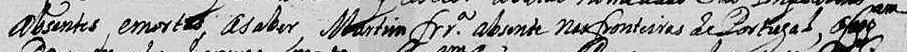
absentes, e mortas, a saber, Martim frr.a absente nas fronteiras de Portugal, o Cappam
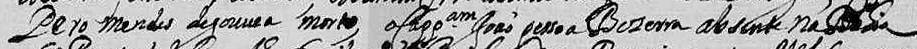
Pero mendes de gouuea morto, o Capp.am Joaõ pessoa Bezerra absente na Bahia
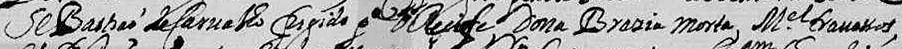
SeBastiaõ de Carualho fugido p.a o Recife, Dona Brazia morta, M.el trauassos,
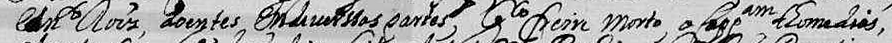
E Anto Roiz̄, doentes en diuerssas partes, Glo freire morto, o Cappam thome dias,
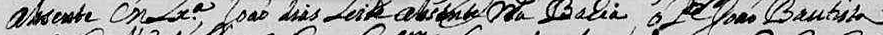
absente en Lx.a, João dias Leite absente na Bahia, o P.e Joaõ Bautista
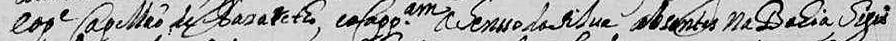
e o pe Capellaõ de Nazareth, e o Capp.am aSensso da silua absentes na Bahia Segi
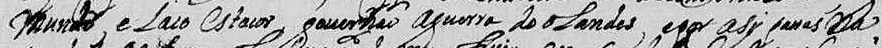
mundo, e Laco Estacor gouernaõ a guerra do olandes, e por asy passar na
